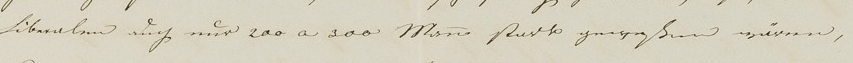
Liberalen auch nur 200 a 300 Mann stark geweßen wären,
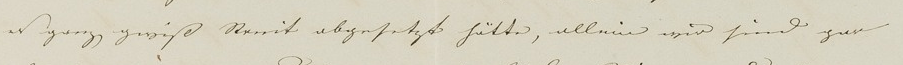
es ganz gewiß Streit abgesetzt hätte, allein wir sind gar
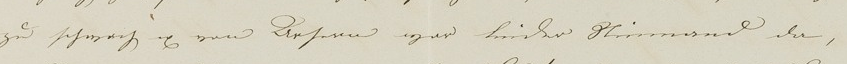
zu schwach & von Ursern war leider Niemand da,
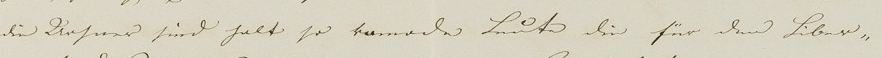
die Ursner sind halt so komode Leute die für den Liber-
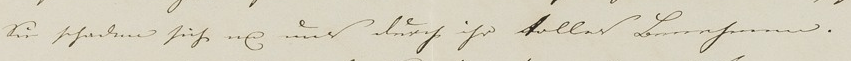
Sie schaden sich & uns durch ihr tolles Benehmen. –
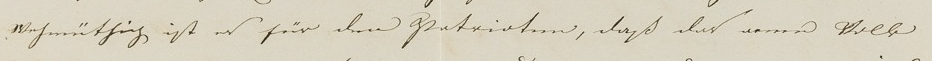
Wehmüthig ist es für den Patrioten, daß das arme Volk
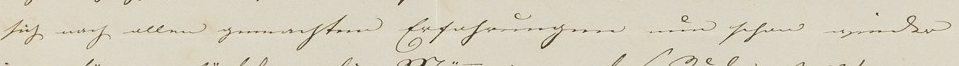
sich nach allen gemachten Erfahrungen nun schon wieder
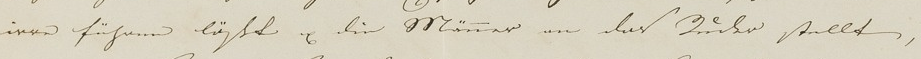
irre führen läßt & die Männer an das Ruder stellt,
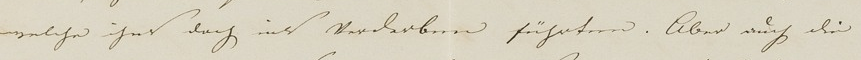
welche ihns doch ins Verderben führten. Aber auch die
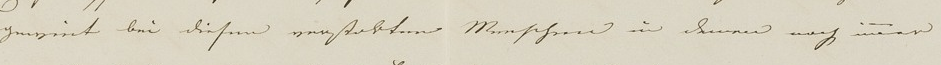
gewint bei diesen verstokten Menschen in denen noch immer
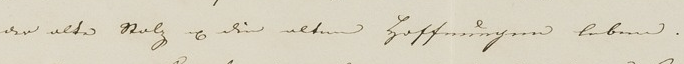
der alte Stolz & die alten Hoffnungen leben.
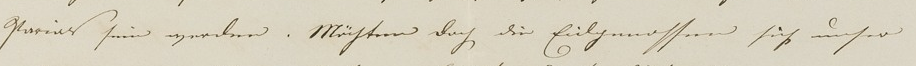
Parias sein werden. Möchten doch die Eidgenossen sich unser
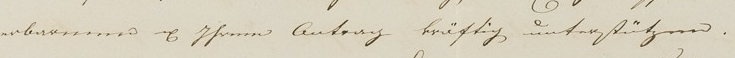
erbarmen & Ihrem Antrag kräftig unterstützen.
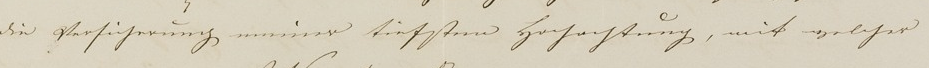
die Versicherung meiner tiefsten Hochachtung, mit welcher
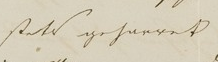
stets geharret
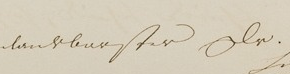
dankbarster Dr.
